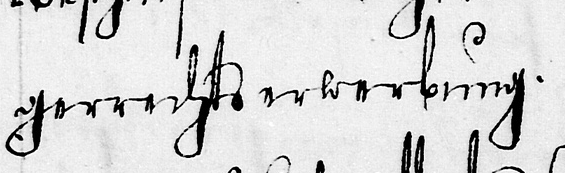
gerrechtserwerbung.
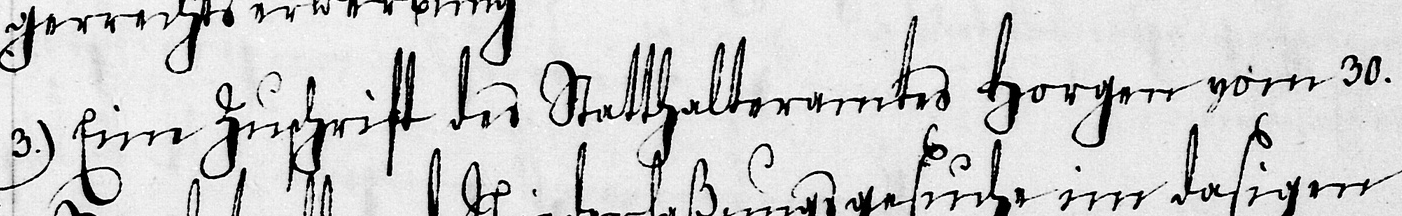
3.) Eine Zuschrift des Statthalteramtes Horgen vom 30.
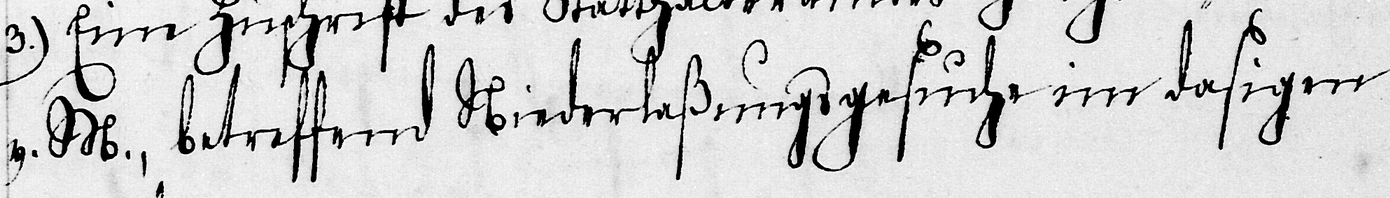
v. M., betreffend Niederlaßungsgesuche im dasigen
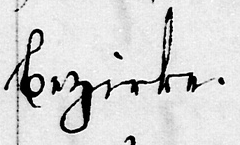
Bezirke.
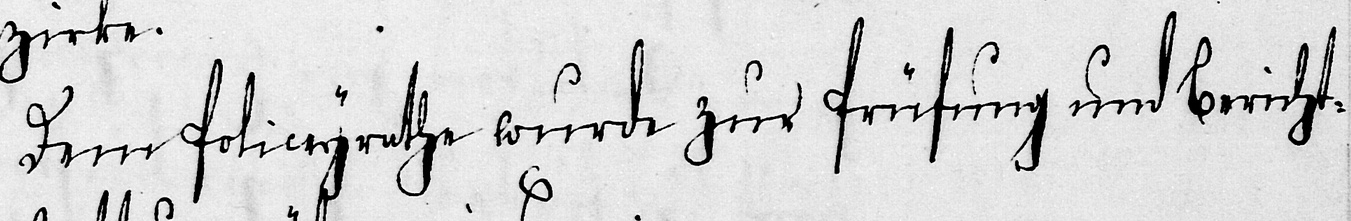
Dem Policeyrathe wurde zur Prüfung und Bericht¬
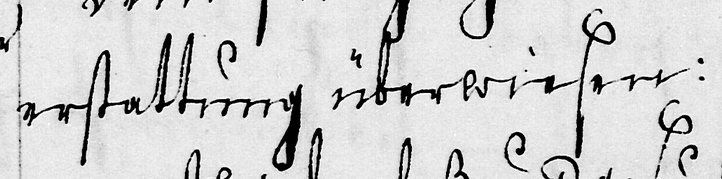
erstattung überwiesen:
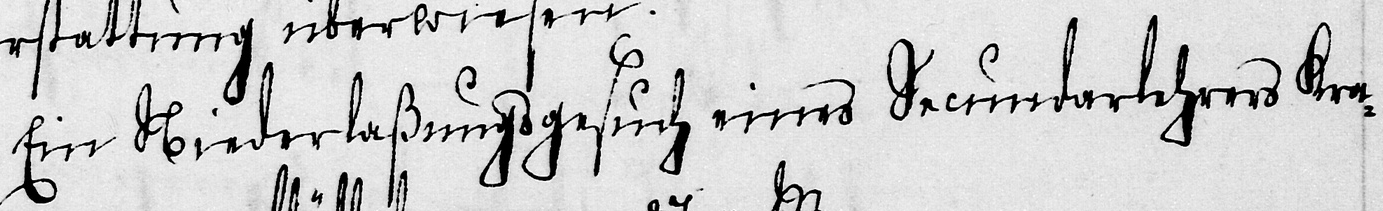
Ein Niederlaßungsgesuch eines Secundarlehrers Kra¬
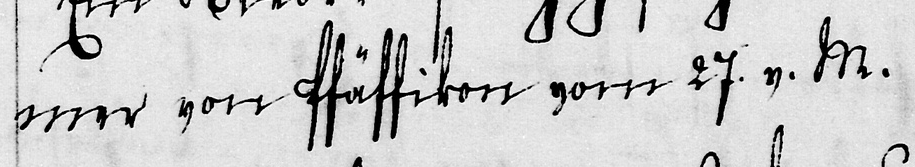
mer von Pfäffikon vom 27. v. M.
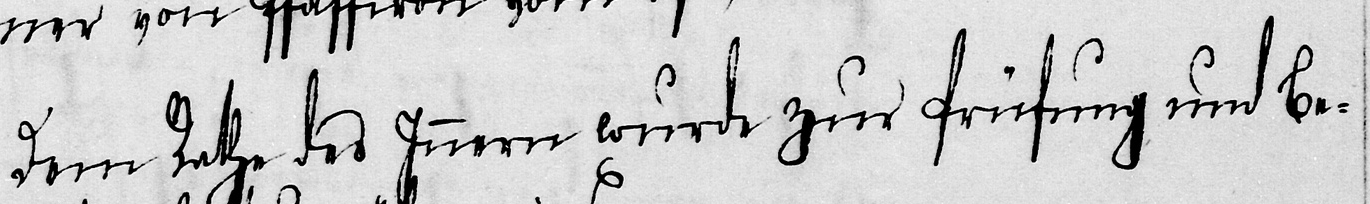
Dem Rathe des Innern wurde zur Prüfung und Ber¬
